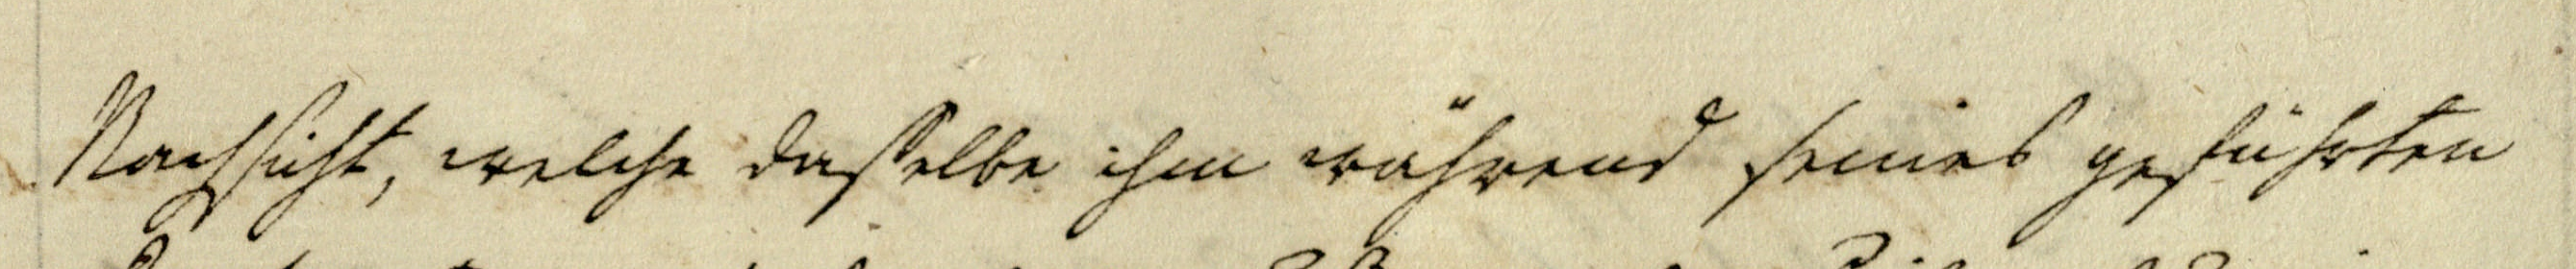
Nachsicht, welche dasselbe ihm während seines geführten
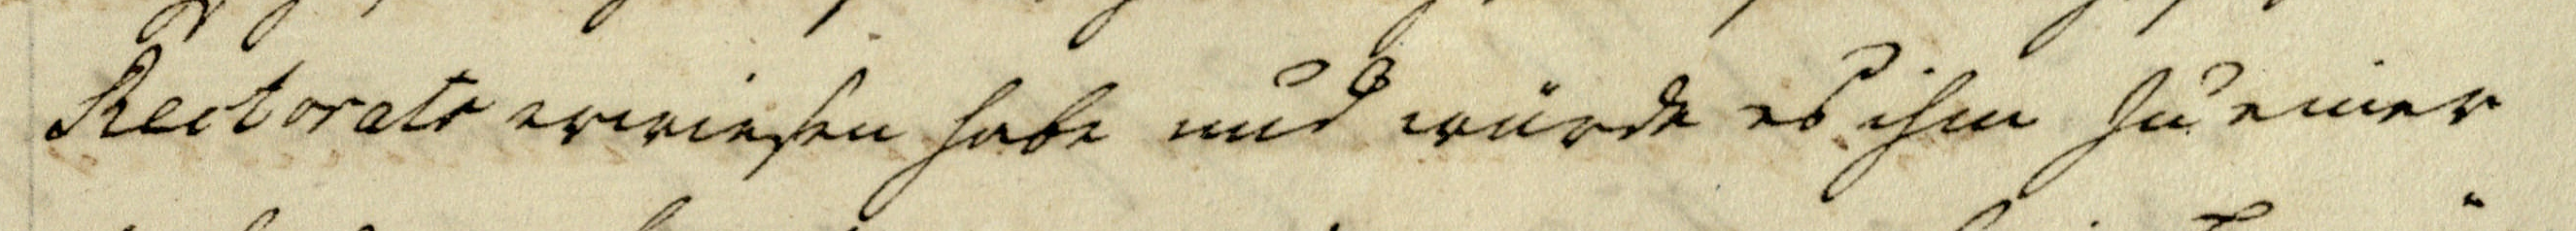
Rectorats erwiesen habe und würde es ihm zu einer
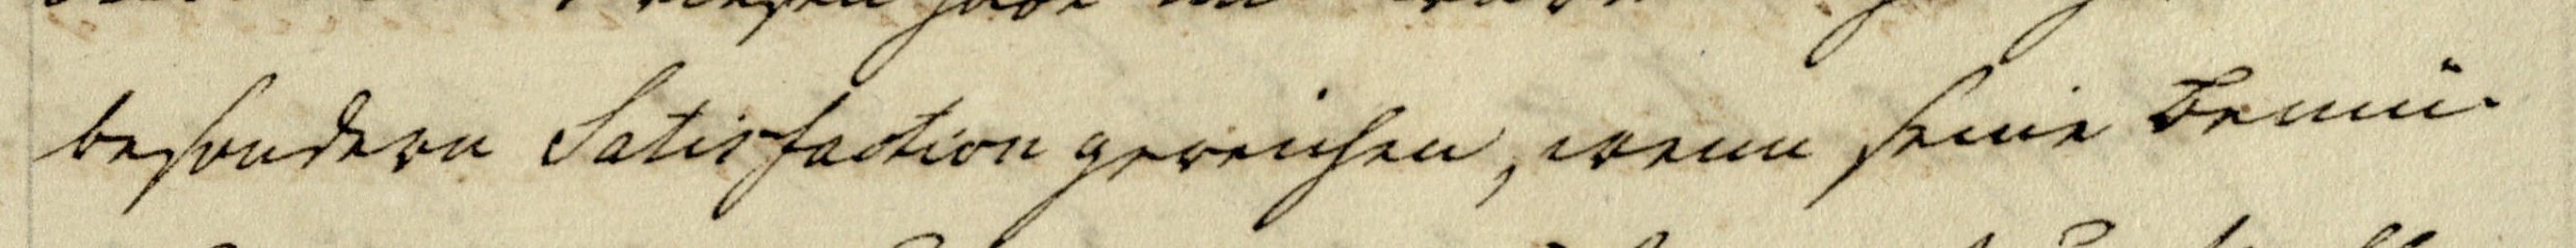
besondern Satisfaction gereichen, wenn seine Bemü¬
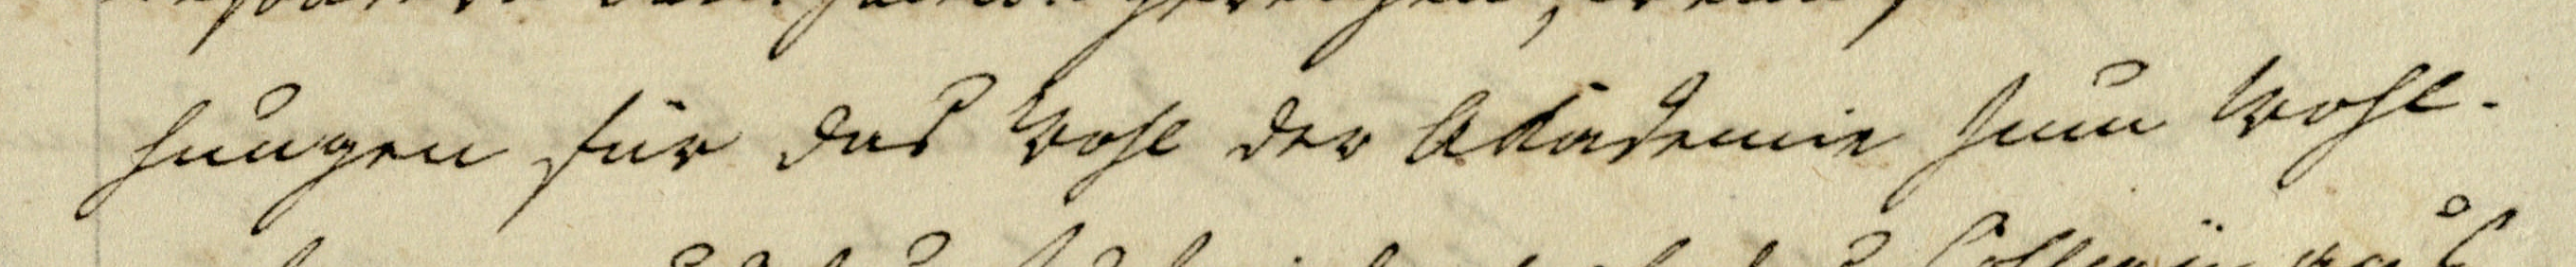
hungen für das Wohl der Akademie zum Wohl¬
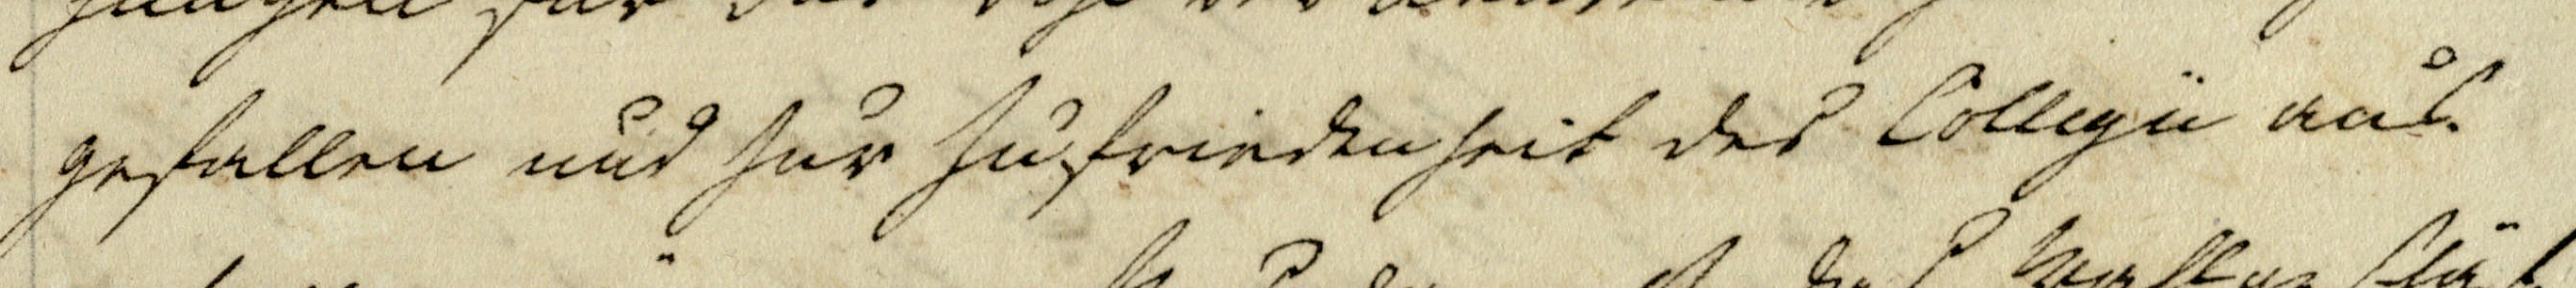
gefallen und zur Zufriedenheit des Collegii aus¬
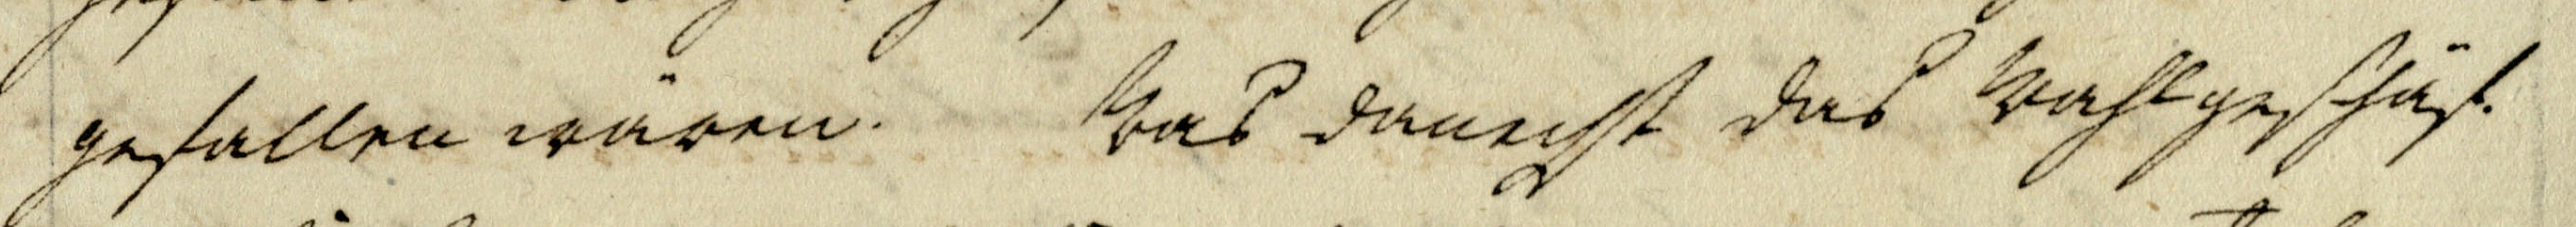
gefallen wären. Was danechst das Wahlgeschäf¬
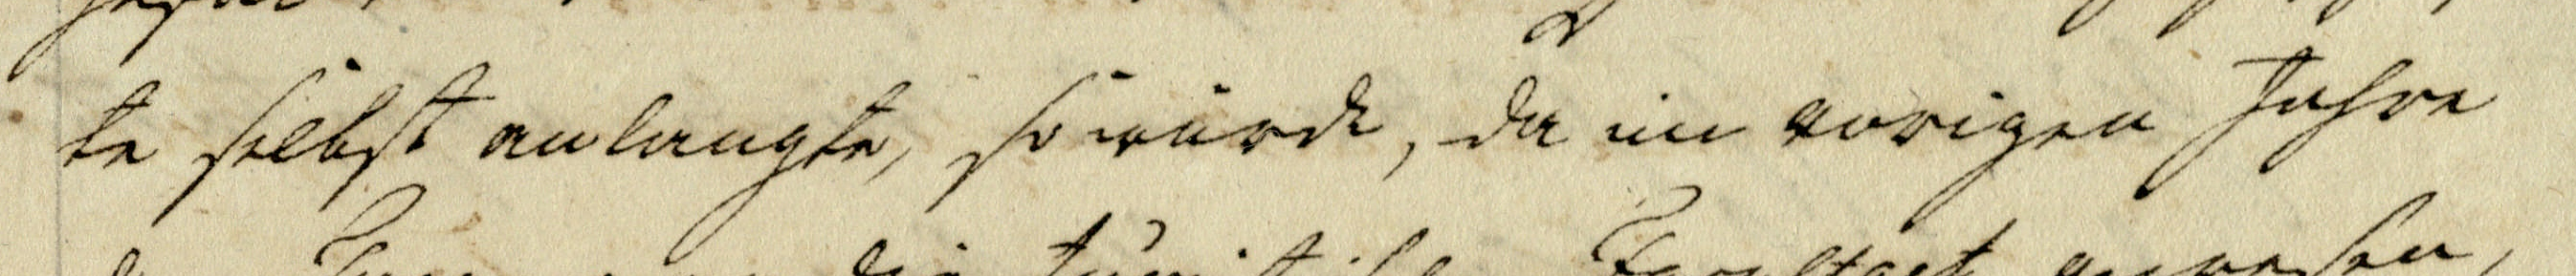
te selbst anlangte, so würde, da im vorigen Jahre
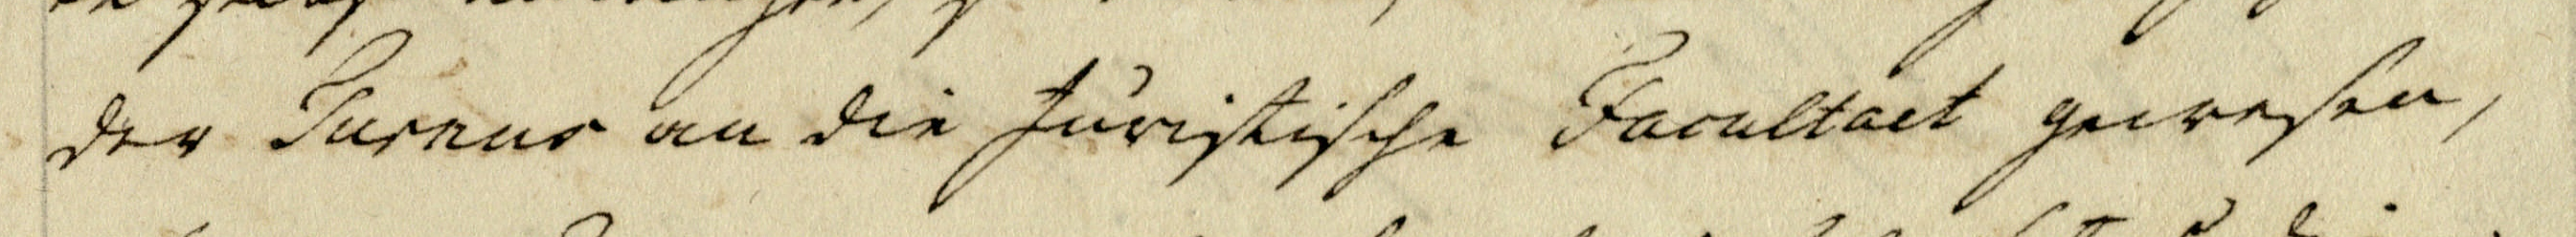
der Turnus an die Juristische Facultaet gewesen,
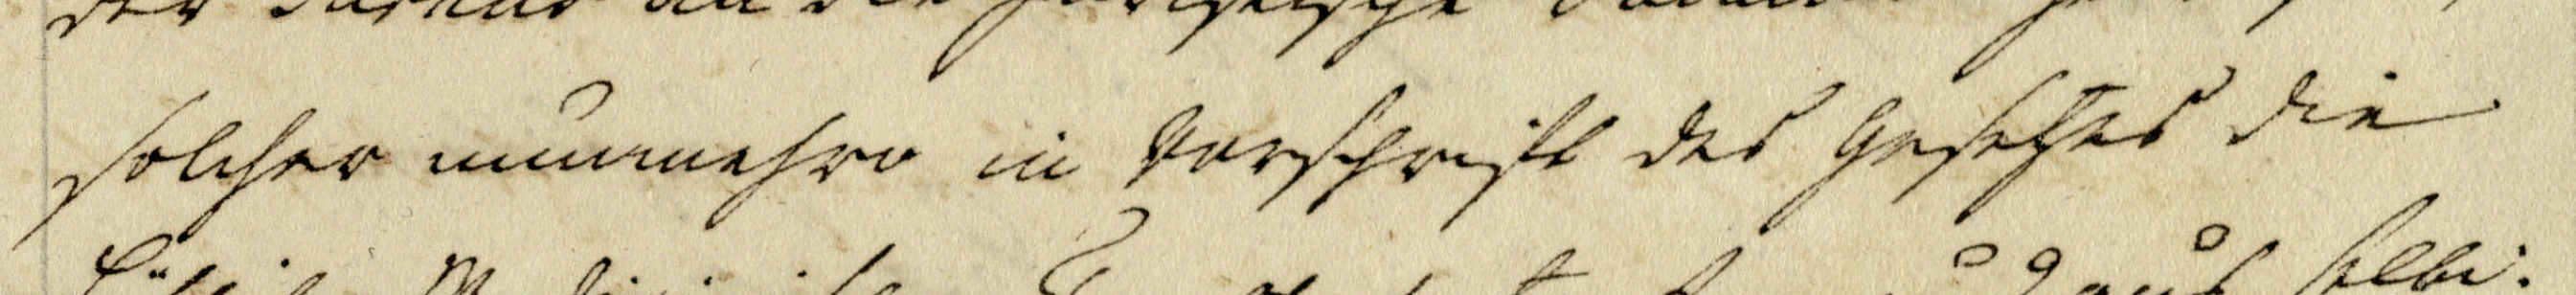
solcher nunmehro in Vorschrift des Gesetzes die
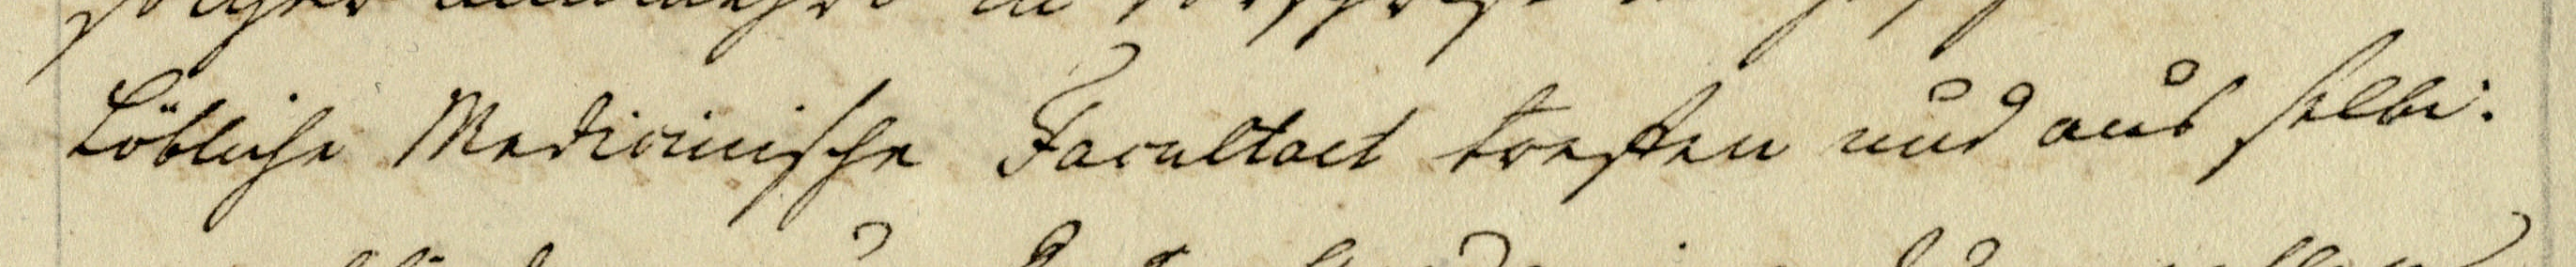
Löbliche Medicinische Facultaet treffen und aus selbi¬
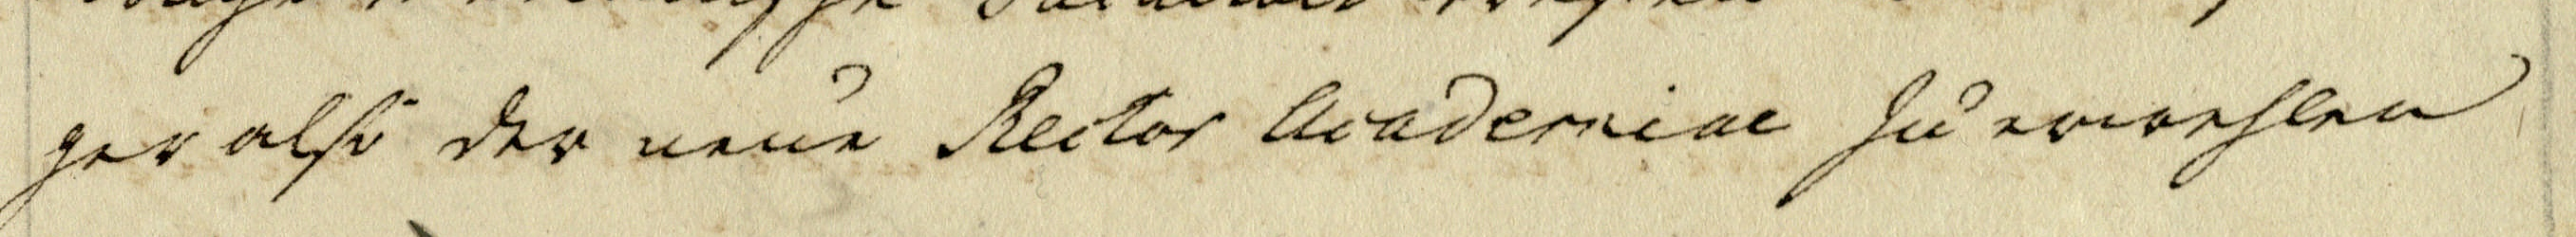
ger also der neue Rector Academiae zu erwehlen
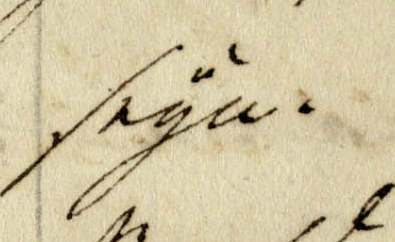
seÿn.
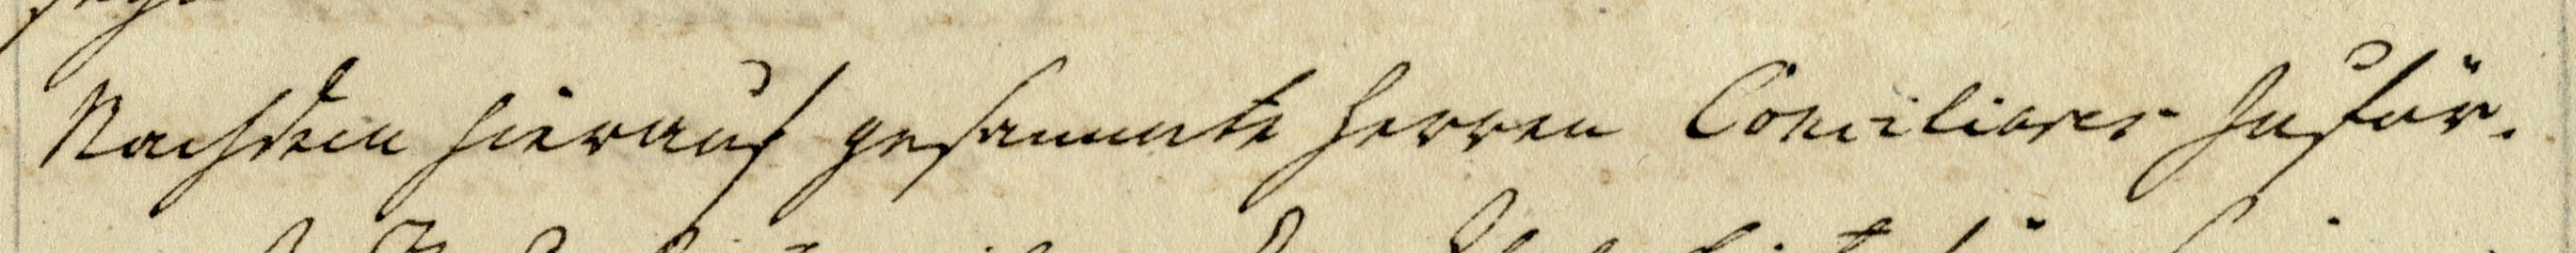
Nachdem hierauf gesammte Herren Conciliares zuför¬
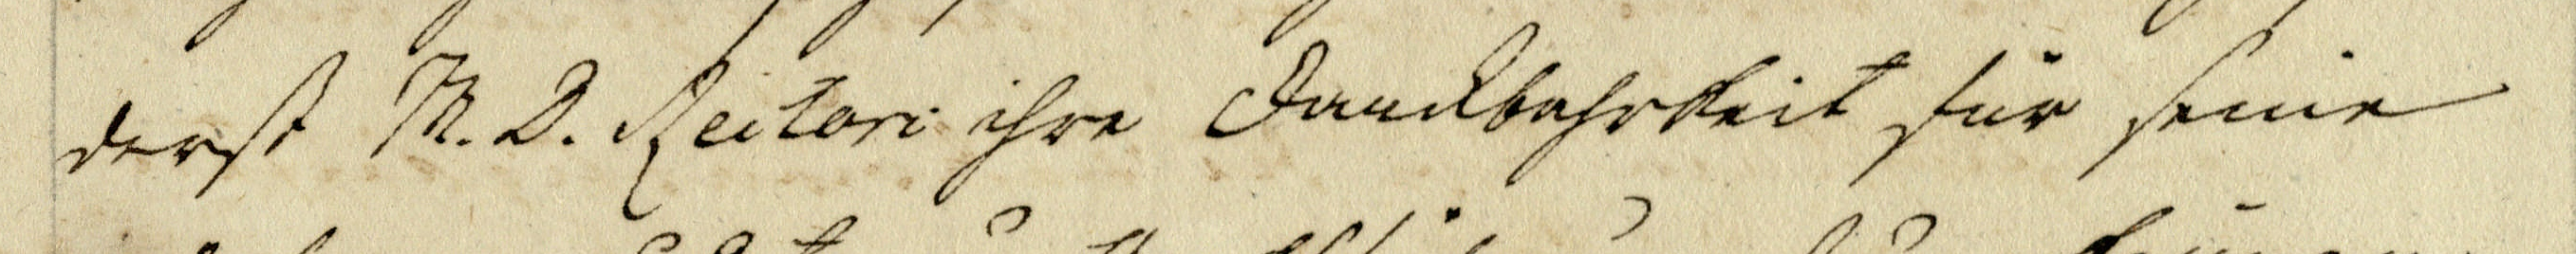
derst M. D. Rectore ihre Danckbahrkeit für seine
